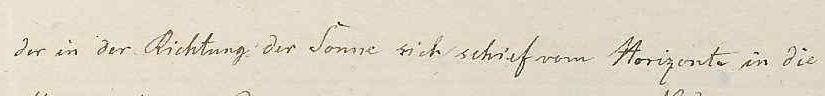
der in der Richtung der Sonne sich schief vom Horizonte in die
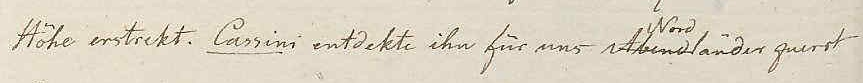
Höhe erstrekt. Cassini entdekte ihn für uns AbendNordländer zuerst
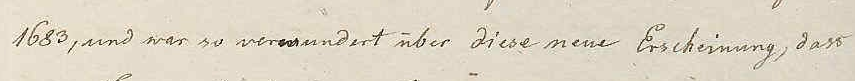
1683, und war so verwundert über diese neue Erscheinung, dass
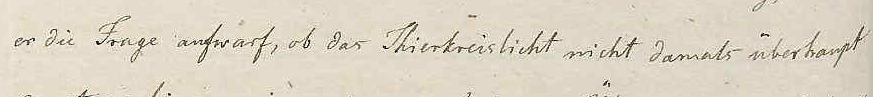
er die Frage aufwarf, ob das Thierkreislicht nicht damals überhaupt
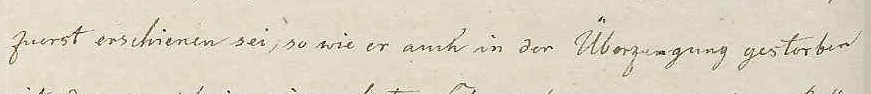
zuerst erschienen sei, so wie er auch in der Überzeugung gestorben
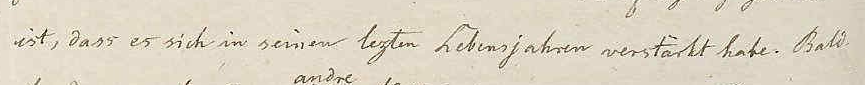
ist, dass es sich in seinen lezten Lebensjahren verstärkt habe. Bald
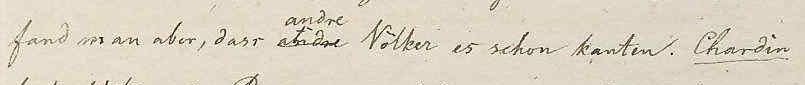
fand man aber, dass andreandre Völker es schon kanten. Chardin
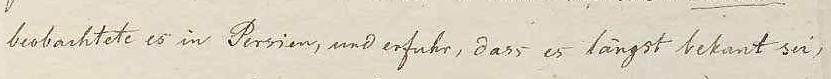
beobachtete es in Persien, und erfuhr, dass es längst bekant sei,
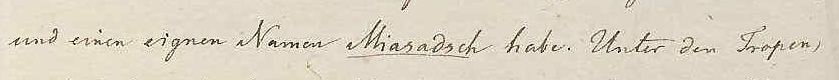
und einen eignen Namen Miasadsch habe. Unter den Tropen,
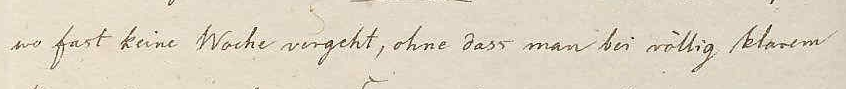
wo fast keine Woche vergeht, ohne dass man bei völlig klarem
